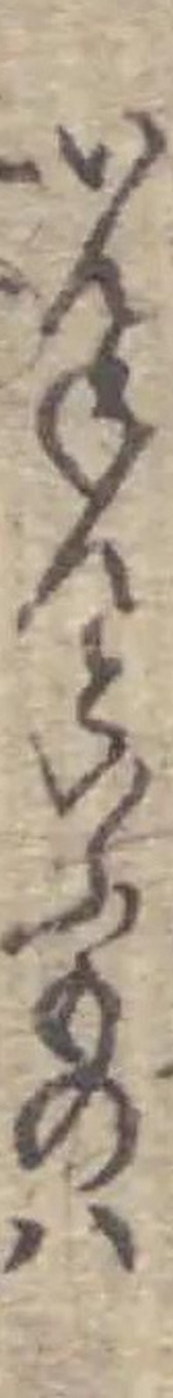いんねんといふものは
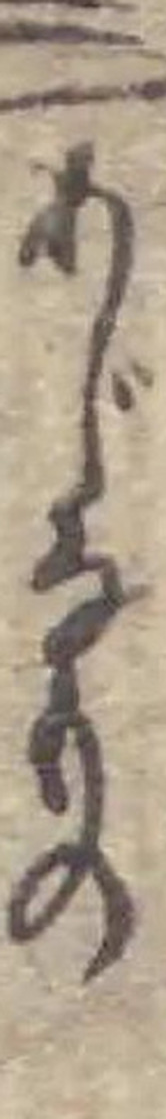あじなもの

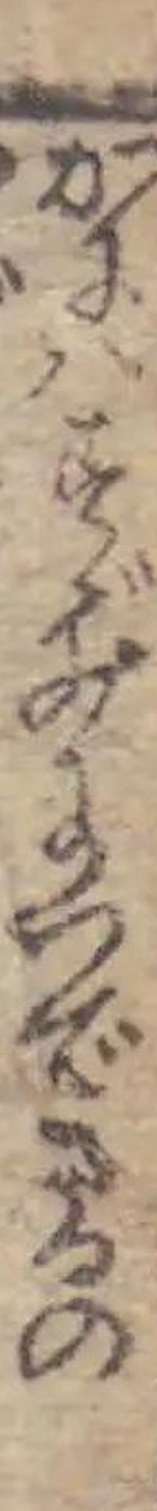かにはすゞみにいでさるの
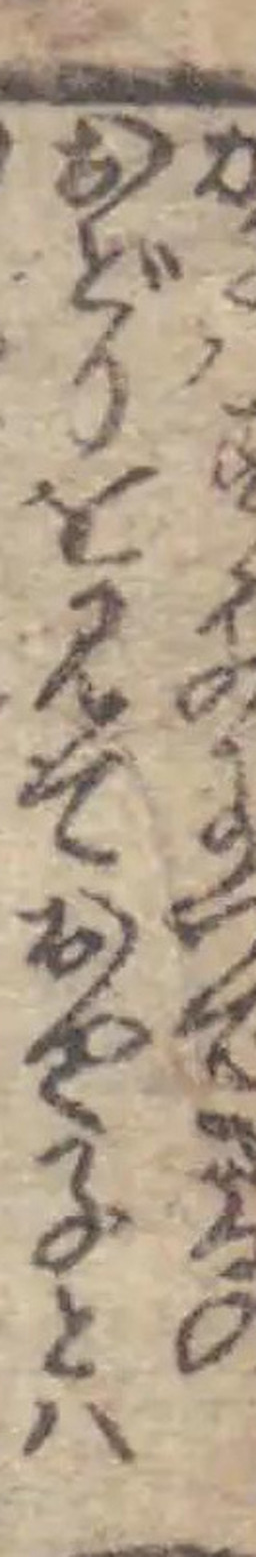おどりを見ておや子とは
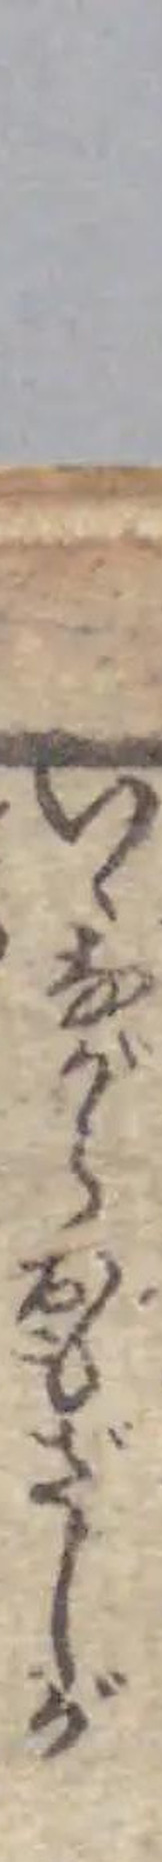いゝながらおもざしが
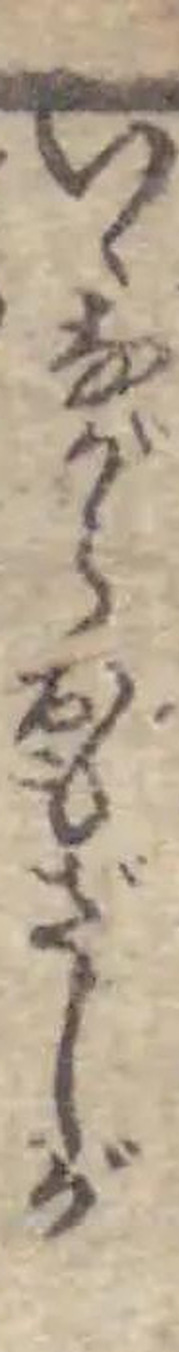いゝながらおもざしが
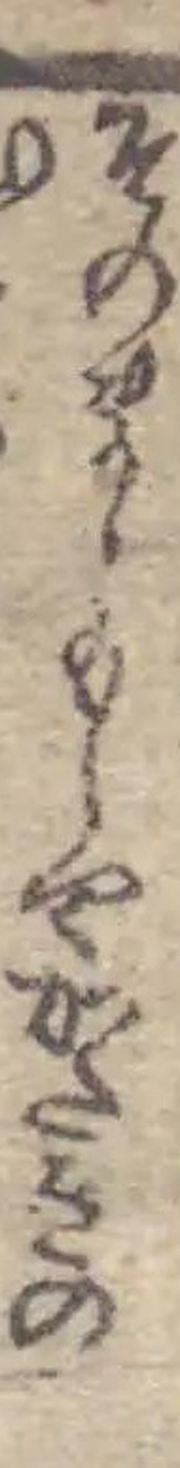そのまゝもしやかたきの
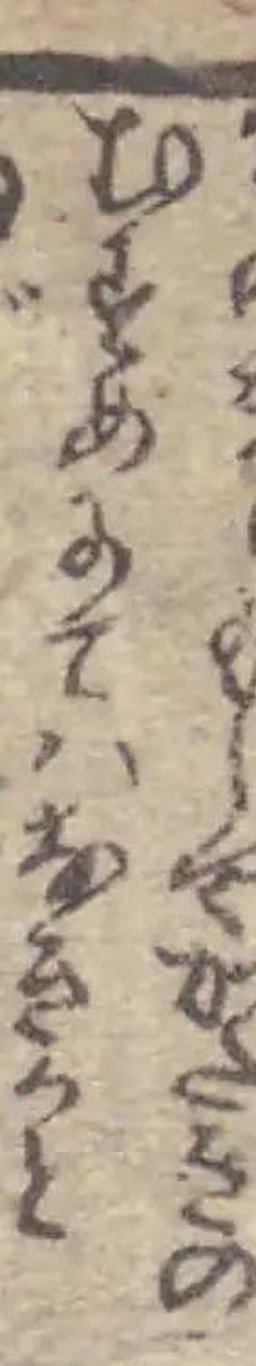むすめにてはなきかと
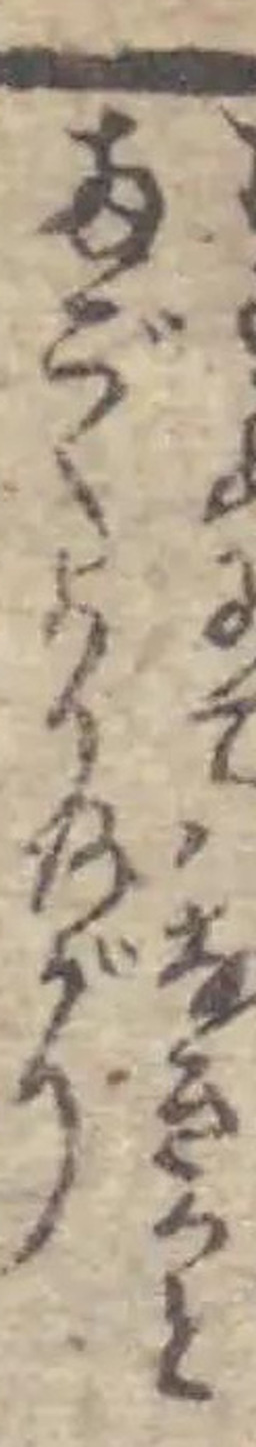両ごくよりあがり
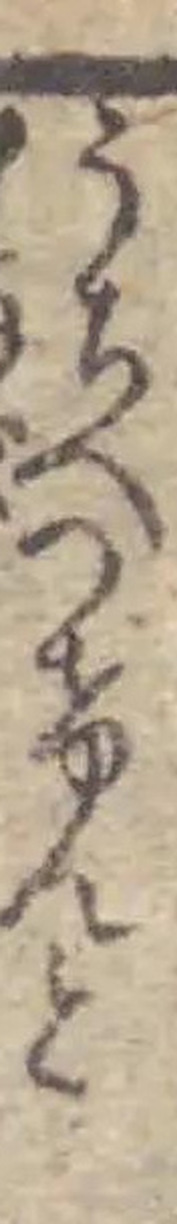うちへつけんと
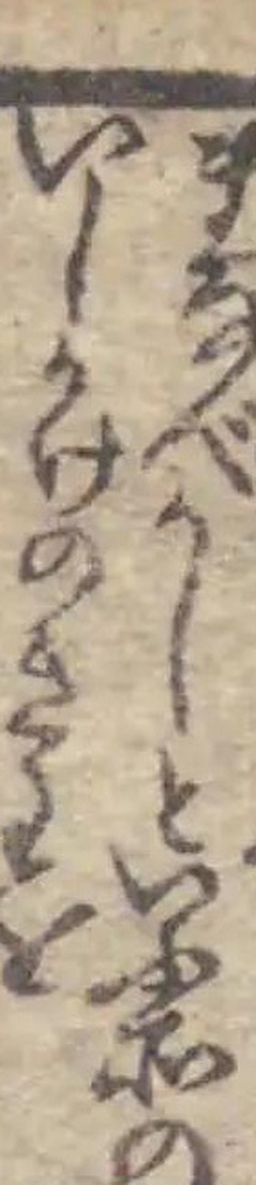いしかけのきわを
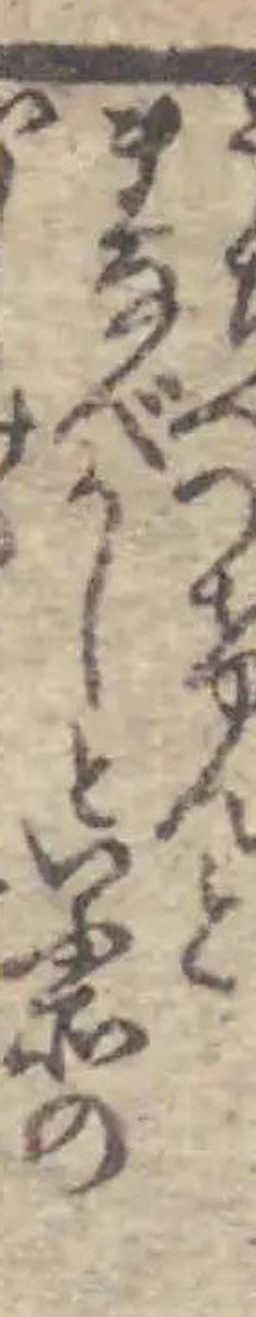まなべかしといふ所の
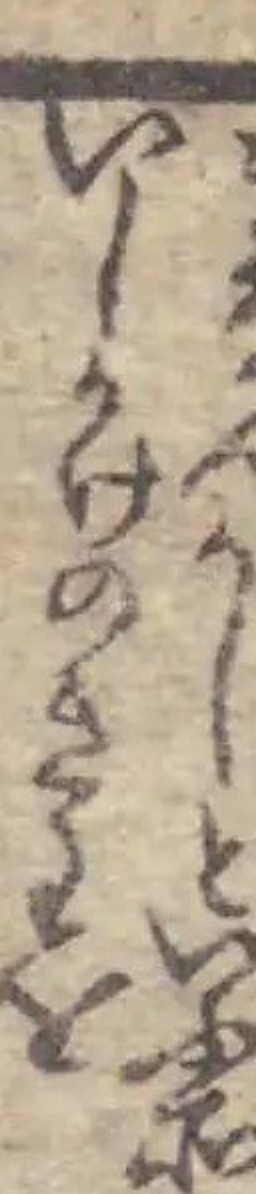いしかけのきわを
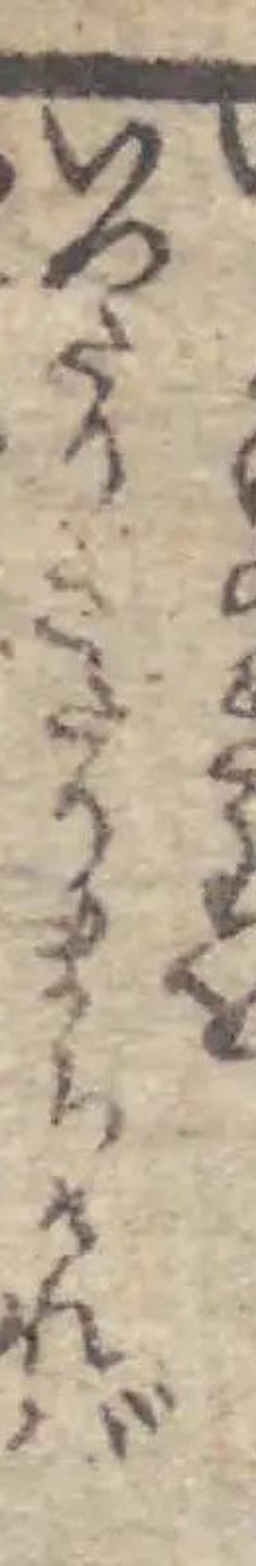いつたりきたりまちければ
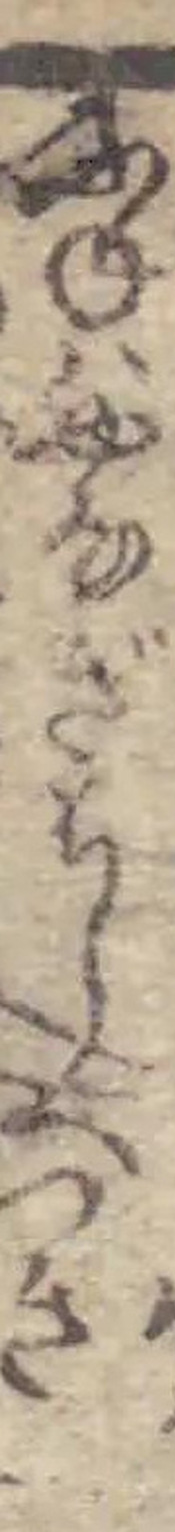ふねはやなぎはしへつき
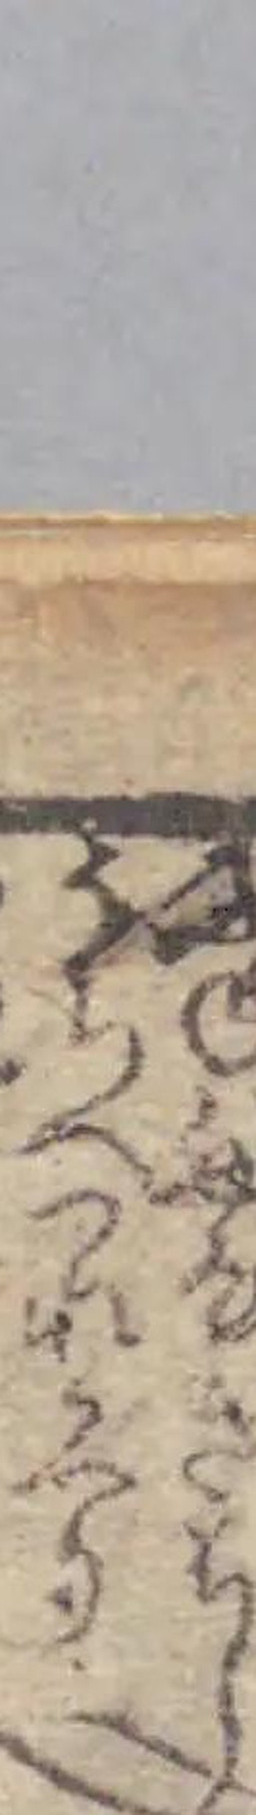うつへつれかへり
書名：蟹牛房挟多 3巻
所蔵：国立国会図書館 National Diet Library, JAPAN
